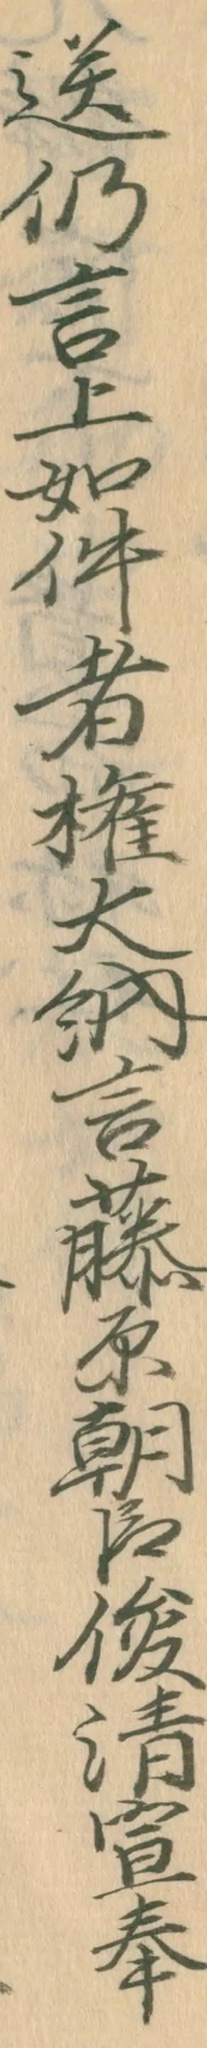送仍言上如件者権大納言藤原朝臣俊清宣奉
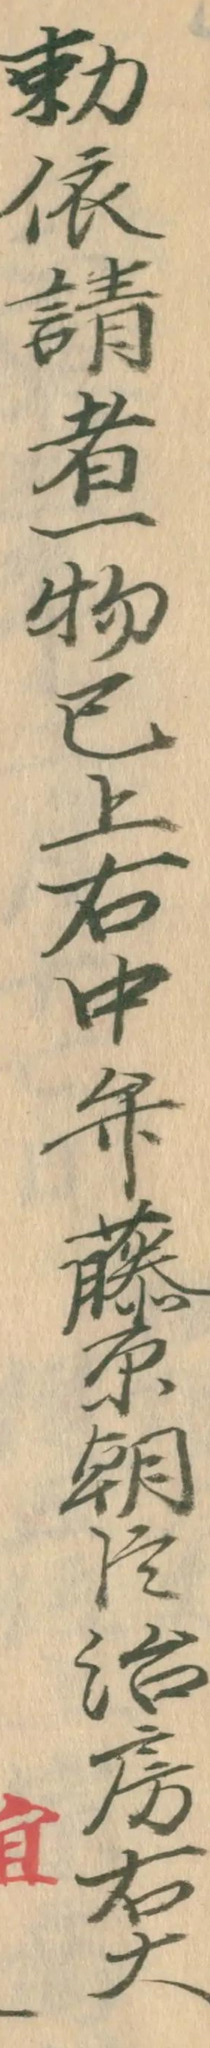勅依請者一物已上右中弁藤原朝臣治房右大
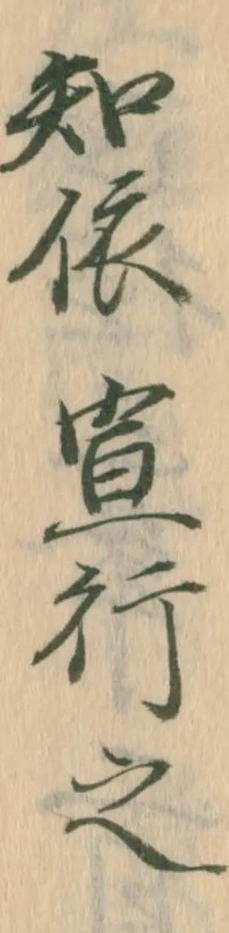知依宣行之
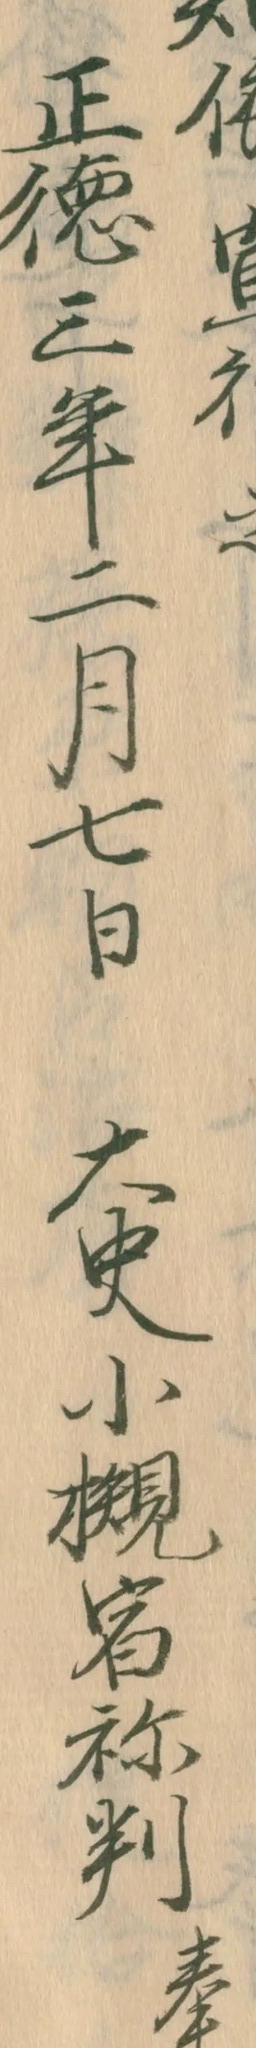正徳三年二月七日大史小槻宿祢判奉
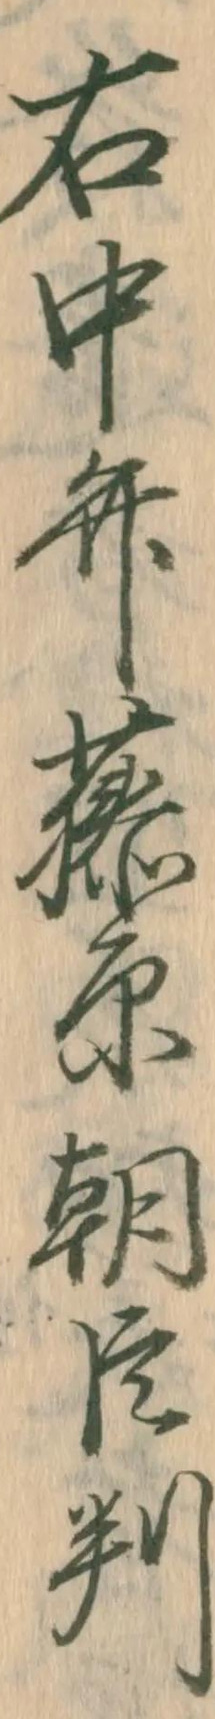右中弁藤原朝臣判
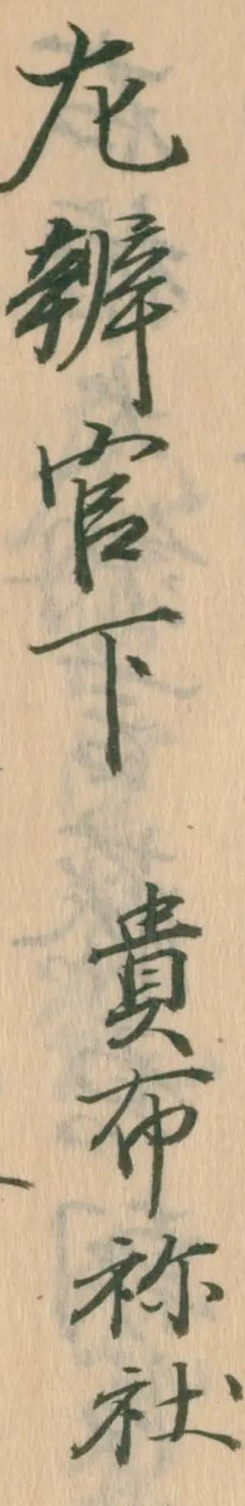左弁官下貴布祢社
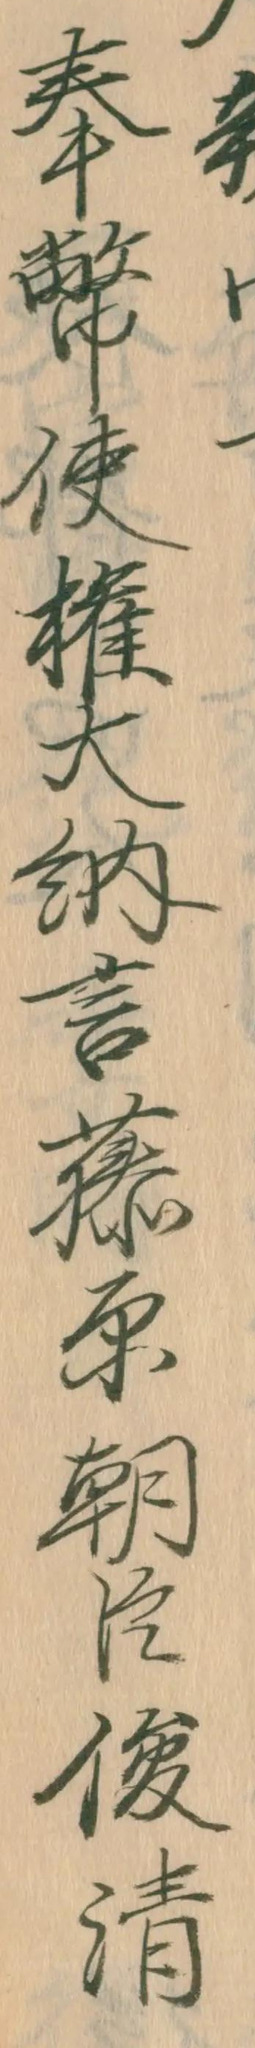奉幣使権大納言藤原朝臣俊清
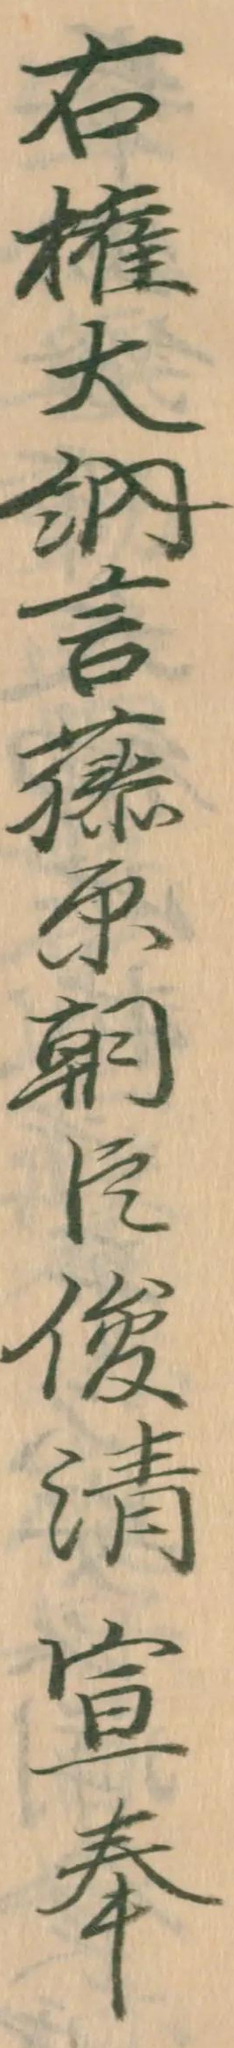右権大納言藤原朝臣俊清宣奉
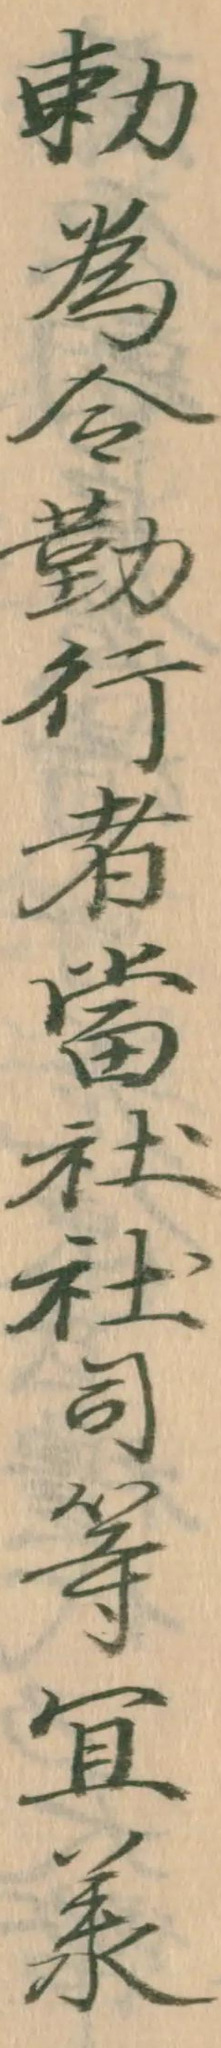勅為令勤行者当社社司等宜承
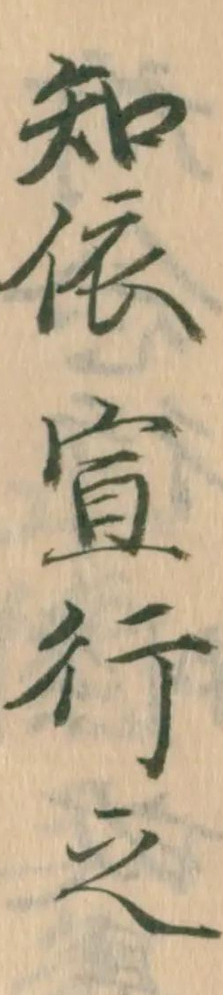知依宣行之
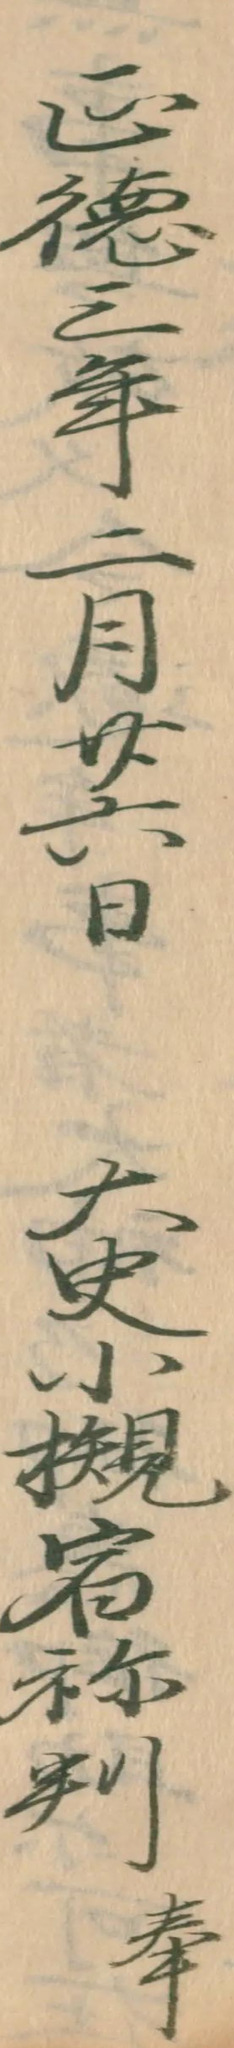正徳三年二月廿六日大史小槻宿祢判奉
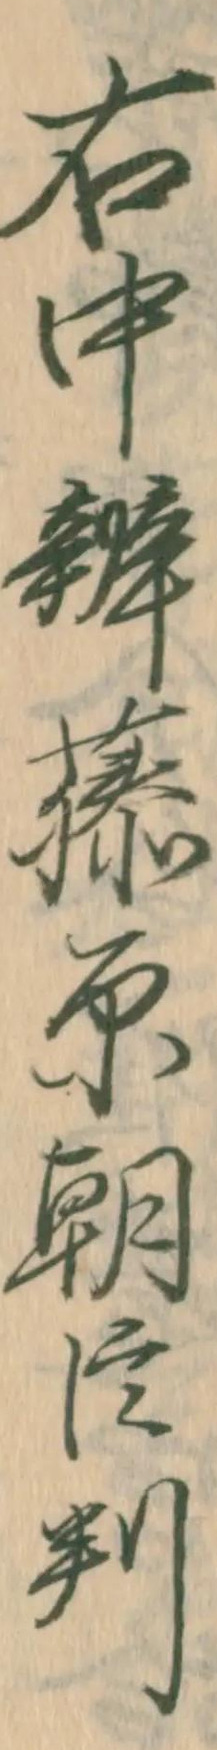右中弁藤原朝臣判
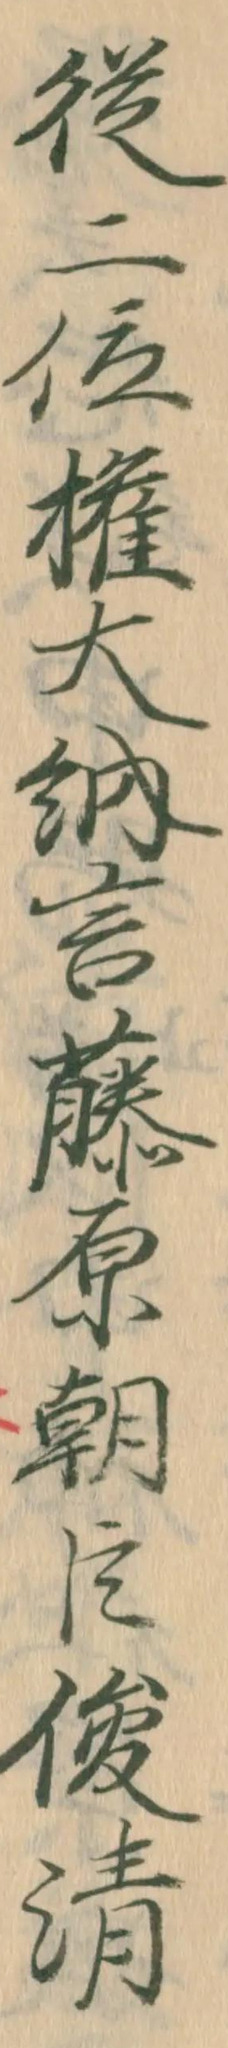従二位権大納言藤原朝臣俊清
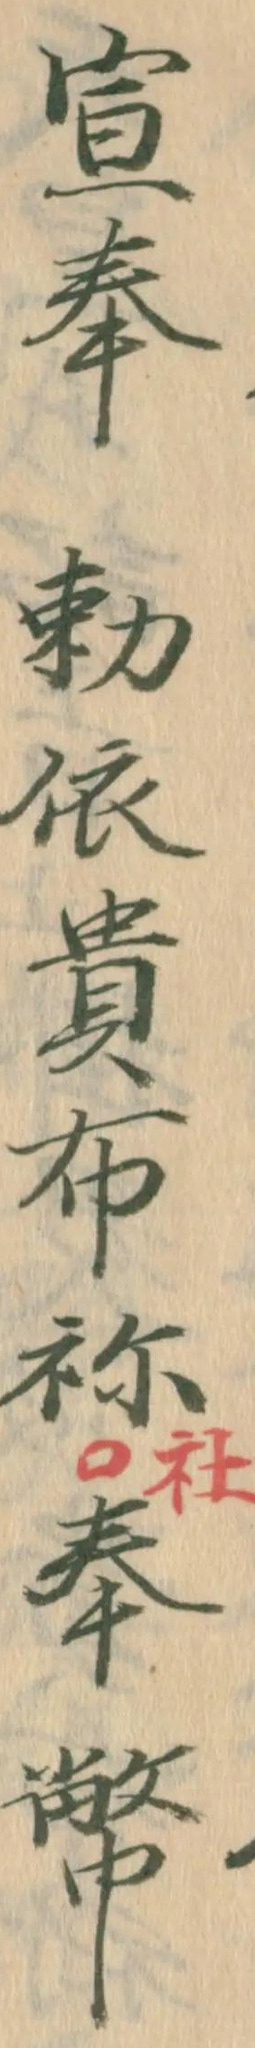宣奉勅依貴布祢￮奉幣
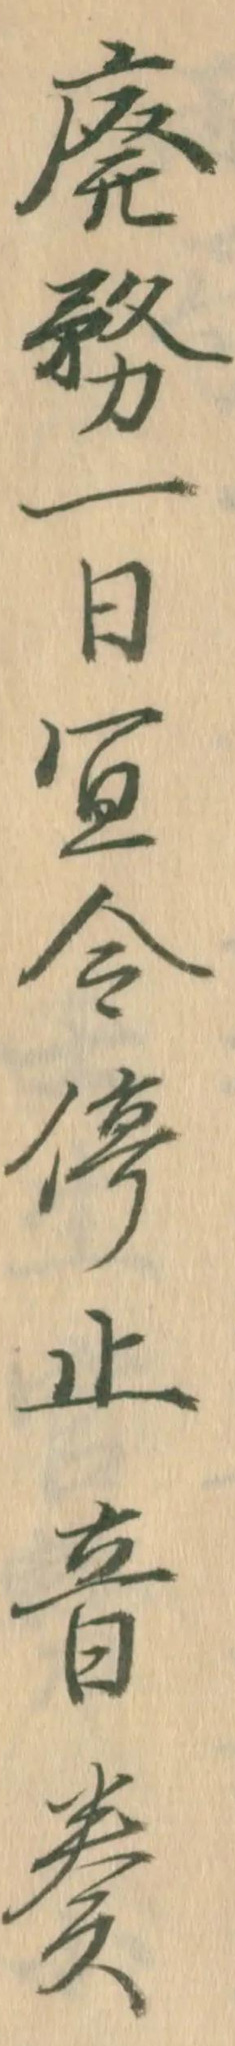廃務一日宜令停止音奏
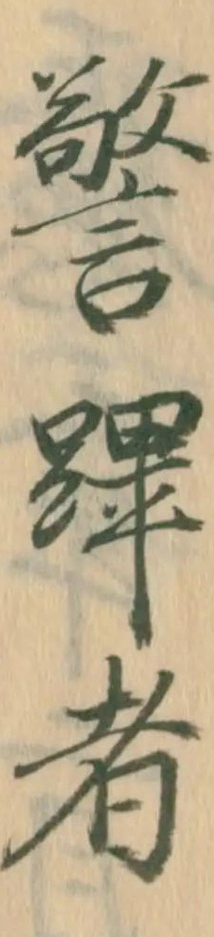警蹕者
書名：賀茂社記録. 第16冊
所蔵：国立国会図書館 National Diet Library, JAPAN
